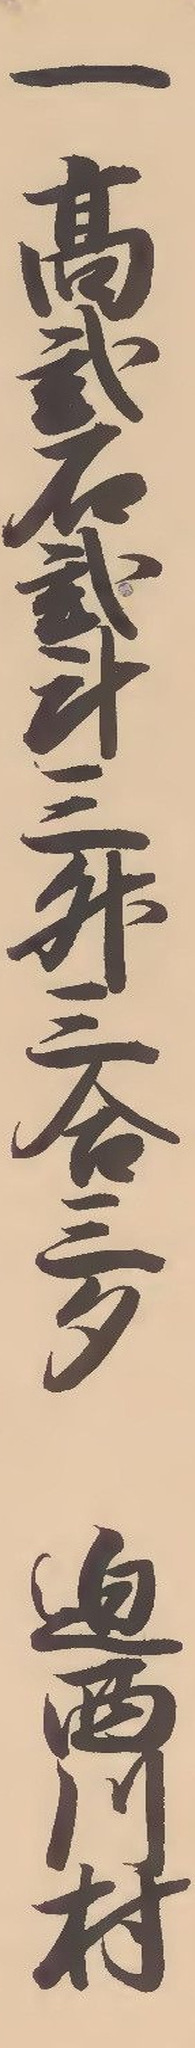一高弐石弐斗三升三合三勺迫西川村
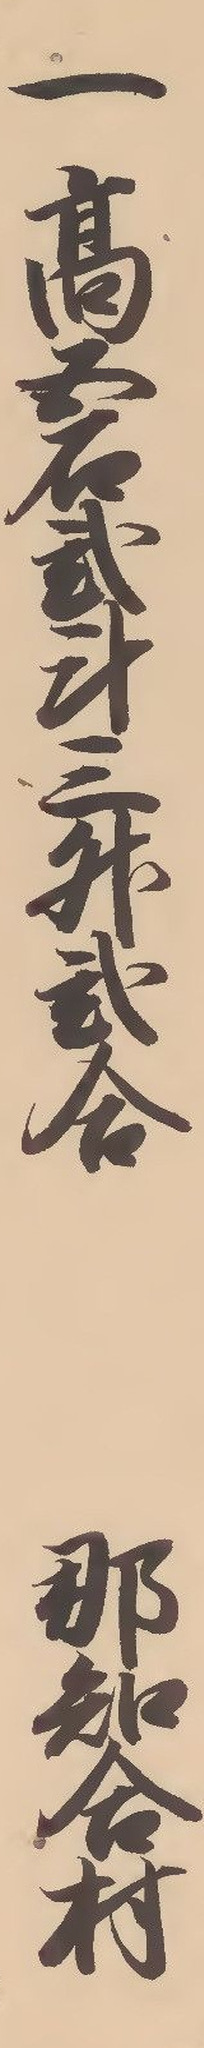一高五石弐斗三升弐合那知合村
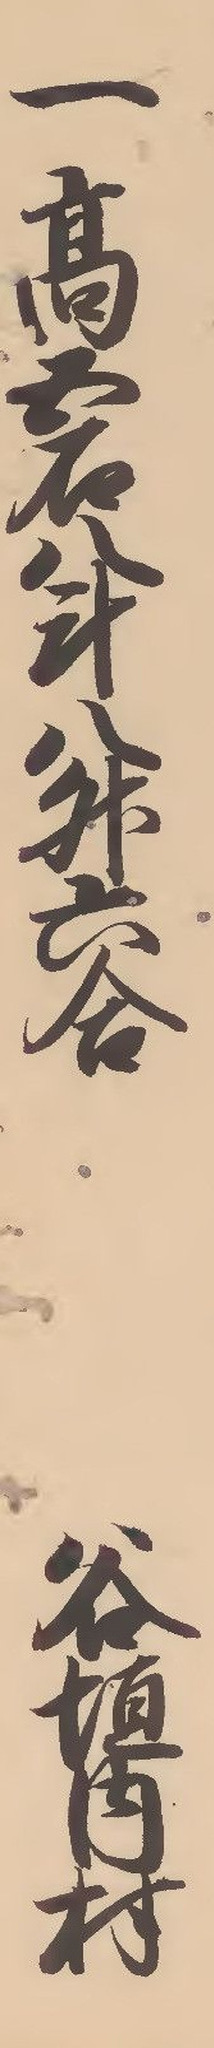一高五石八斗八升六合谷垣内村

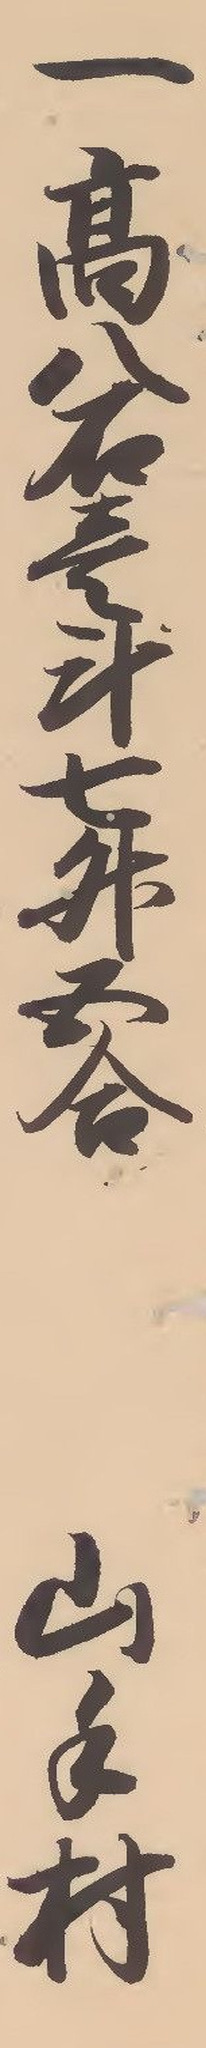一高八石壱斗七升五合山手村
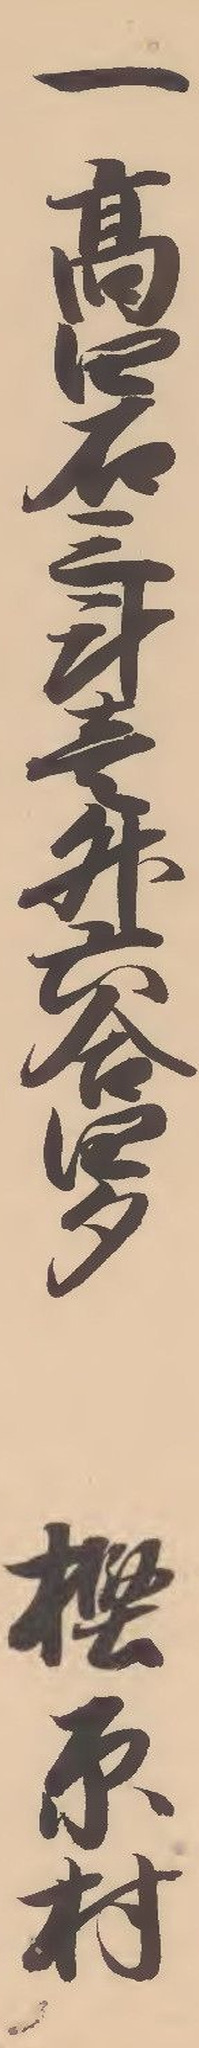一高四石三斗壱升六合四勺樫原村
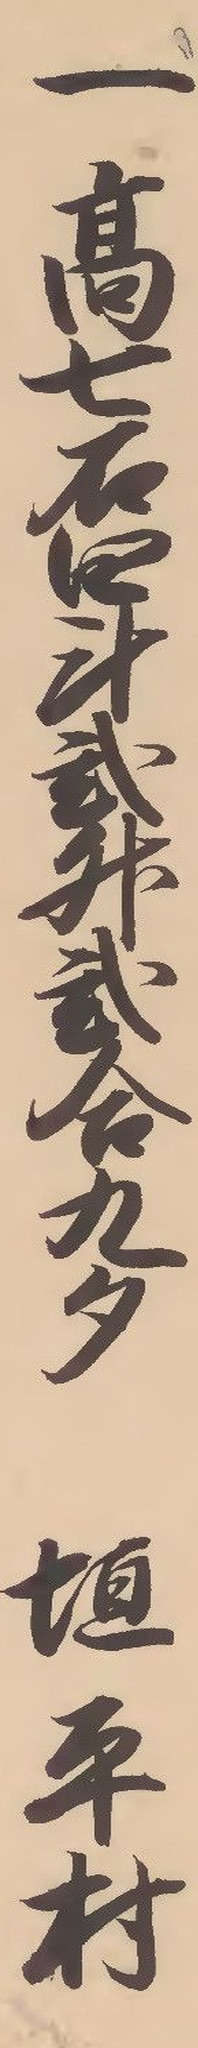一高七石四斗弐升弐合九勺垣平村
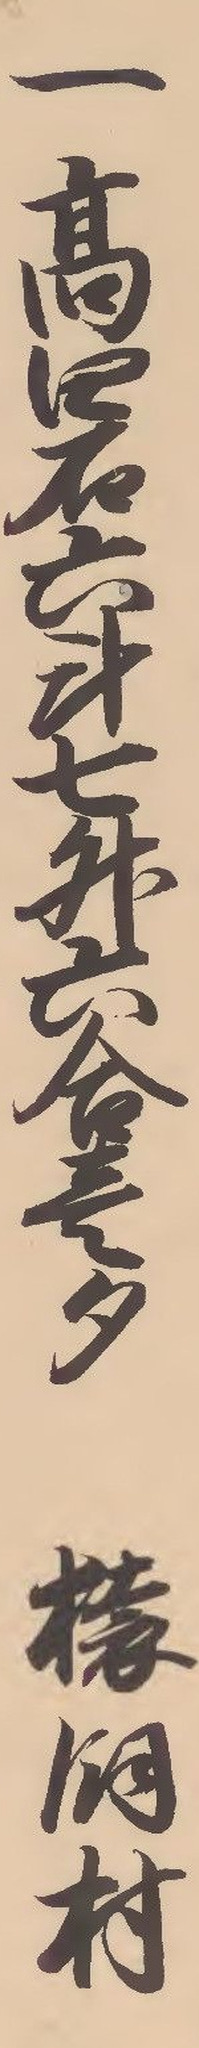一高四石六斗七升六合壱勺猿飼村
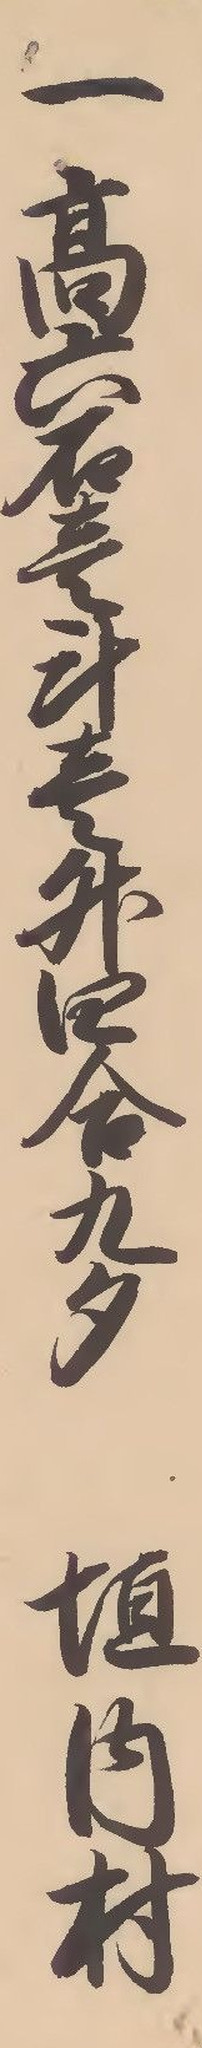一高六石壱斗壱升四合九勺垣内村
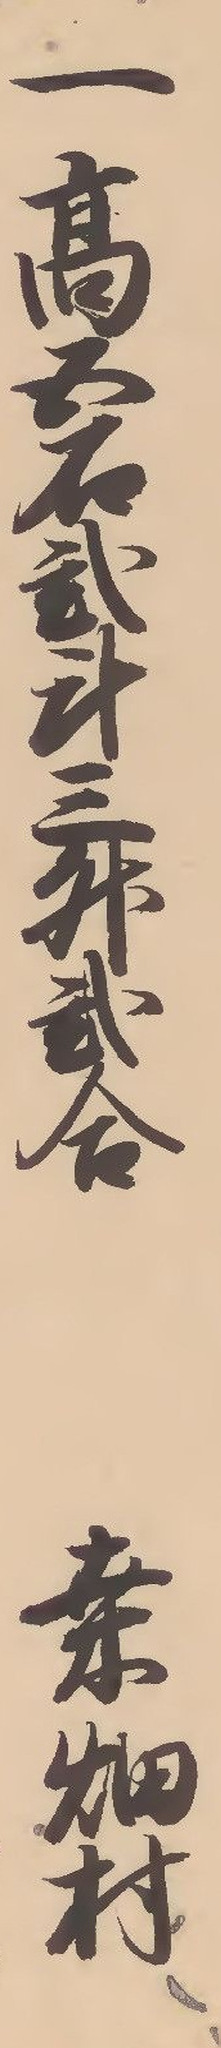一高五石弐斗三升弐合桑畑村
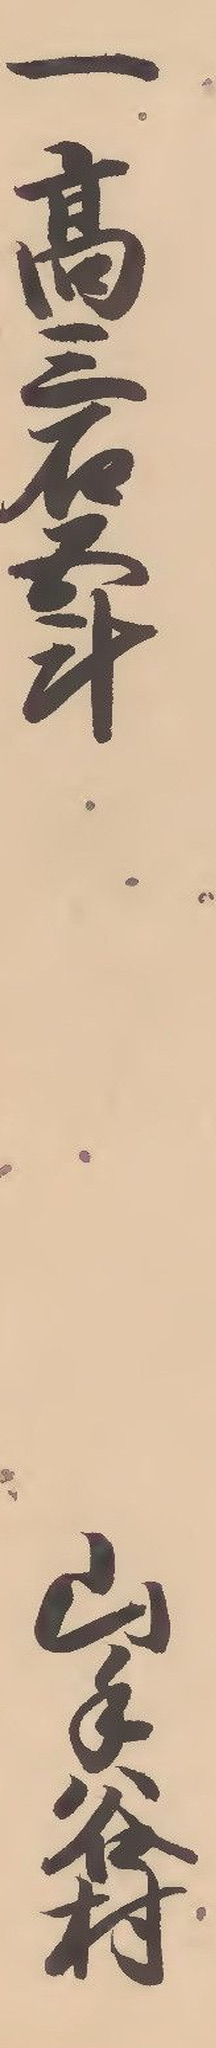一高三石五斗山手谷村

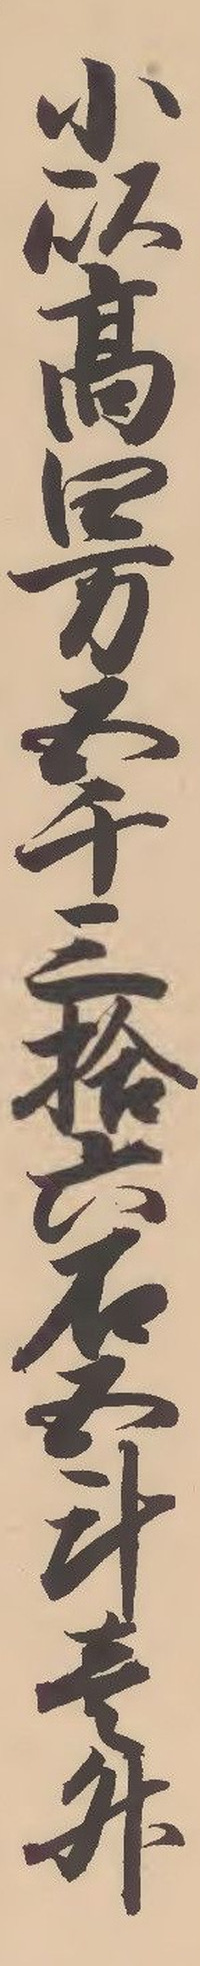小以高四万五千三拾六石五斗壱升
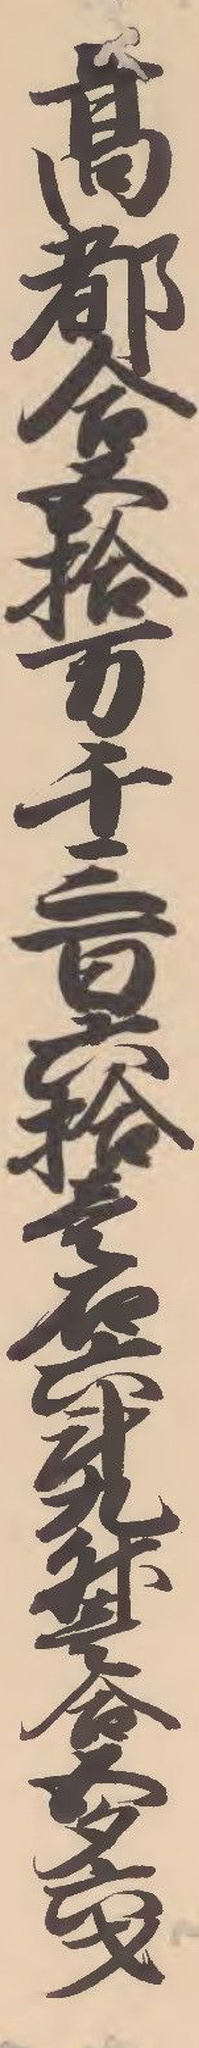高都合拾万千三百六拾壱石六斗九升壱合五勺六才
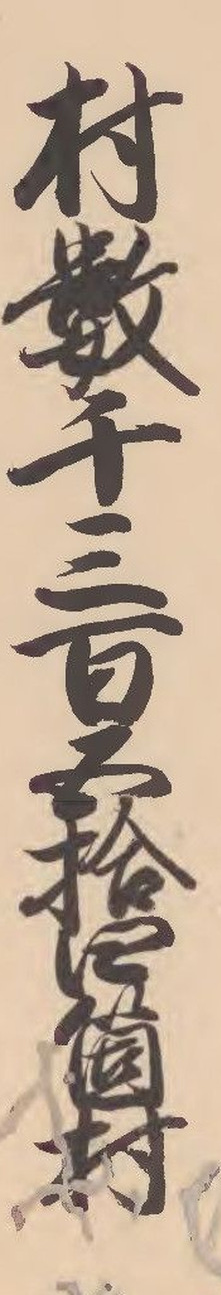村数千三百五拾四箇村

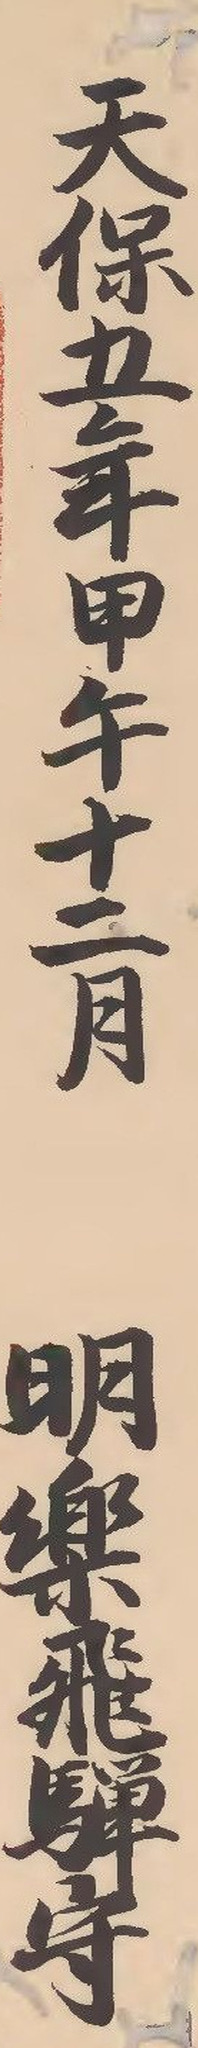天保五年甲午十二月明楽飛騨守
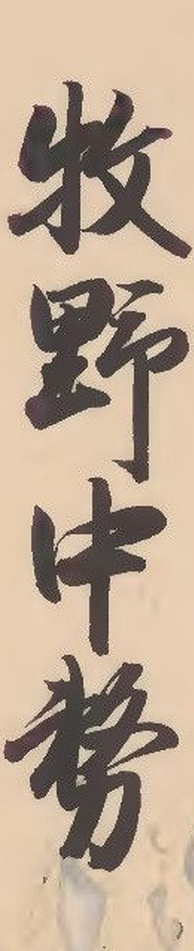牧野中務
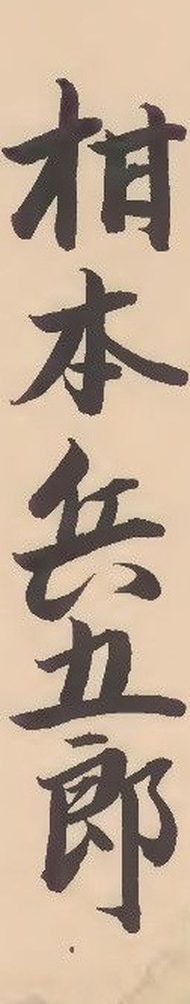柑本兵五郎
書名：大和国郷帳
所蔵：国立公文書館 National Archives of Japan
